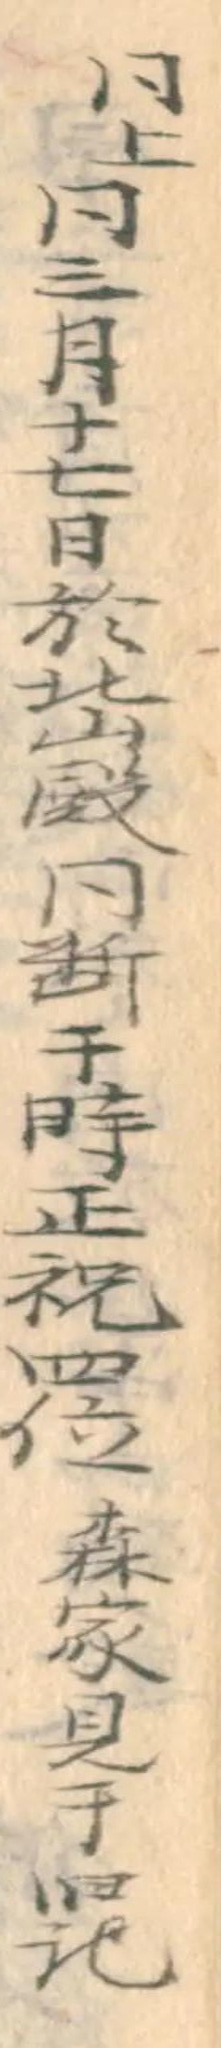同上同三月十七日於北山殿同断于時正祝四位藤家見于旧記
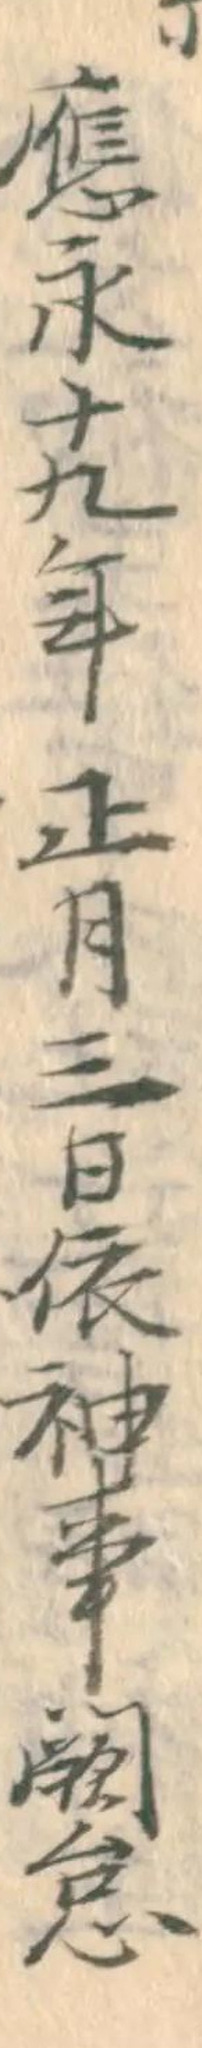重基応永十九年正月三日依神事闕怠
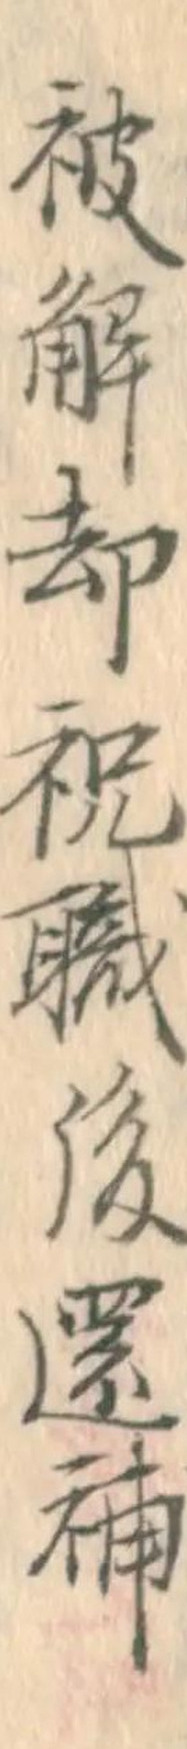被解却祝職後還補
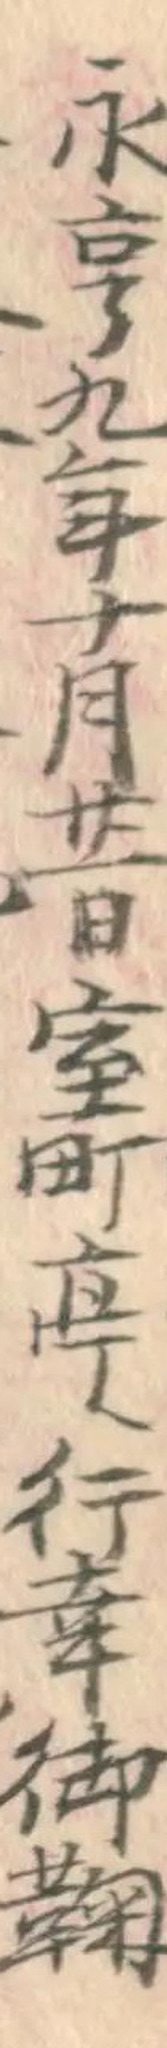永亨九年十月廿一日室町亭へ行幸御鞠
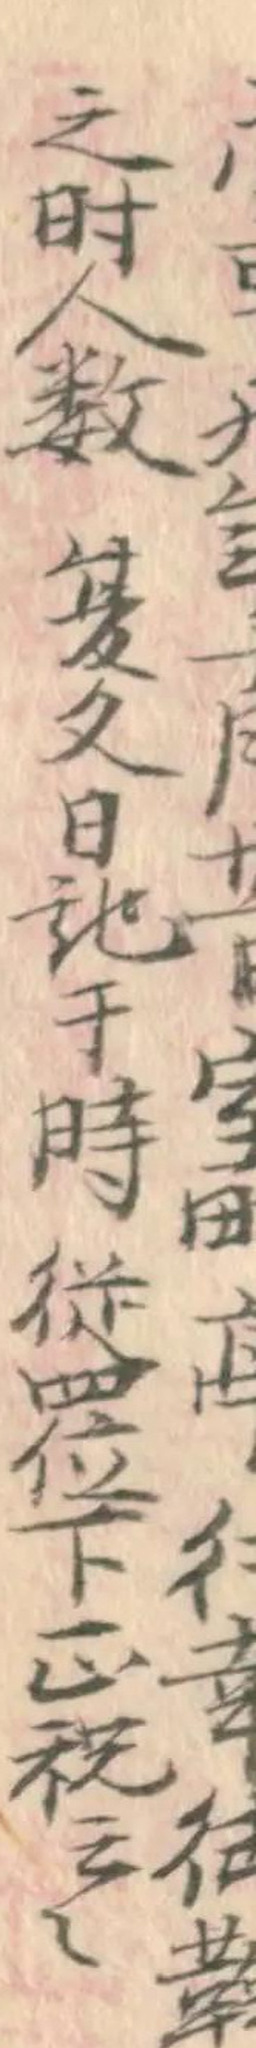之時人数夏久日記于時従四位下正祝云々
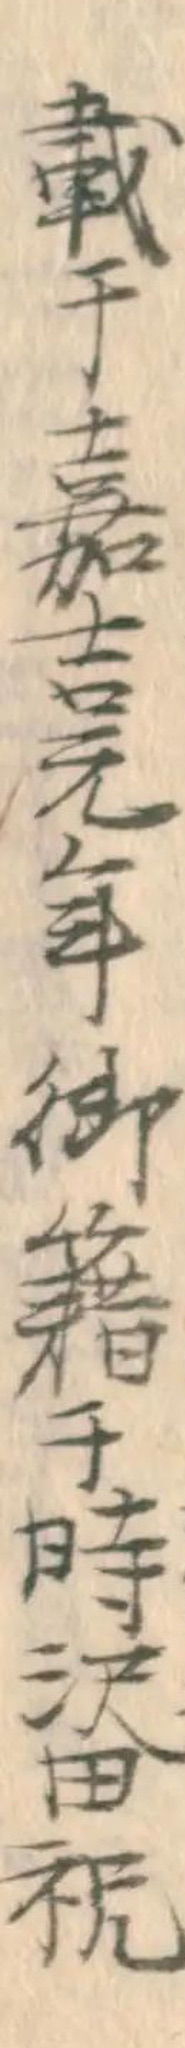載于嘉吉元年御藉于時沢田祝
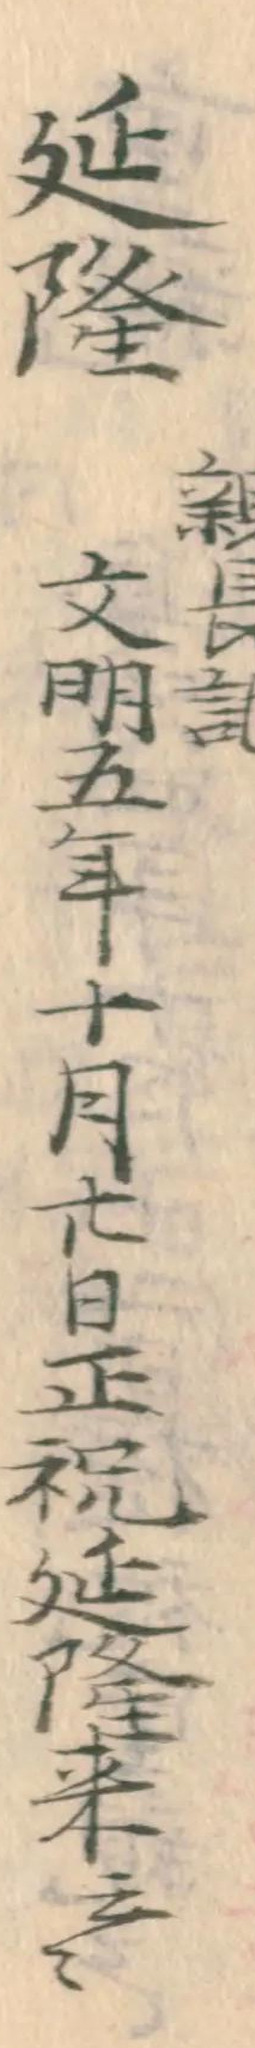延隆文明五年十月廿日正祝延隆来云々
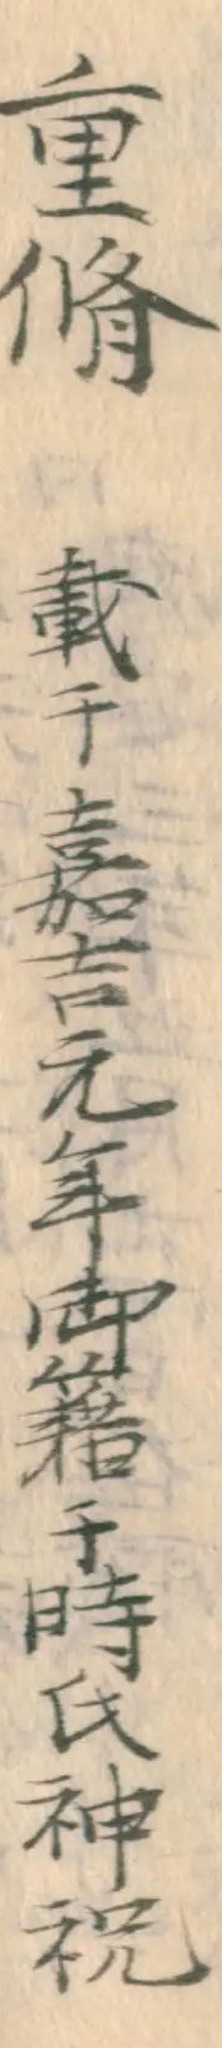重脩載于嘉吉元年御藉于時氏神祝
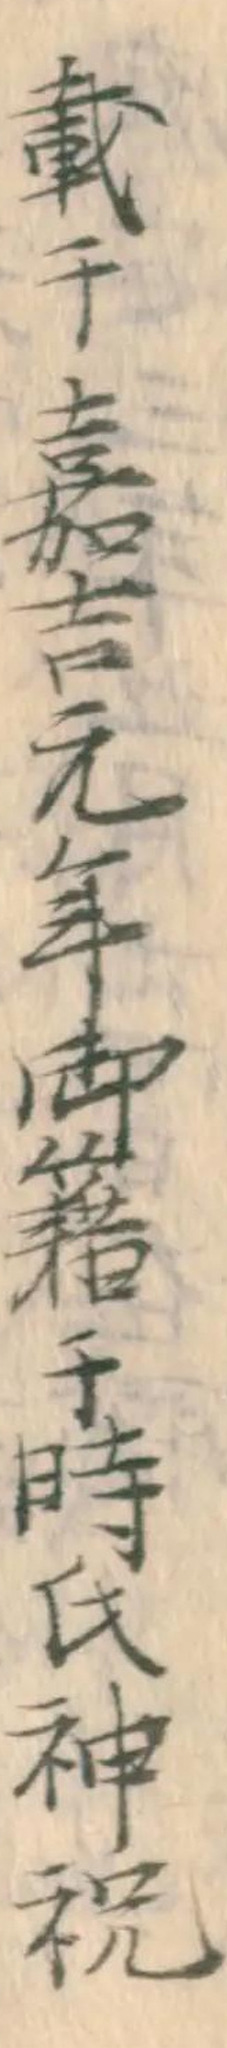重脩載于嘉吉元年御藉于時氏神祝
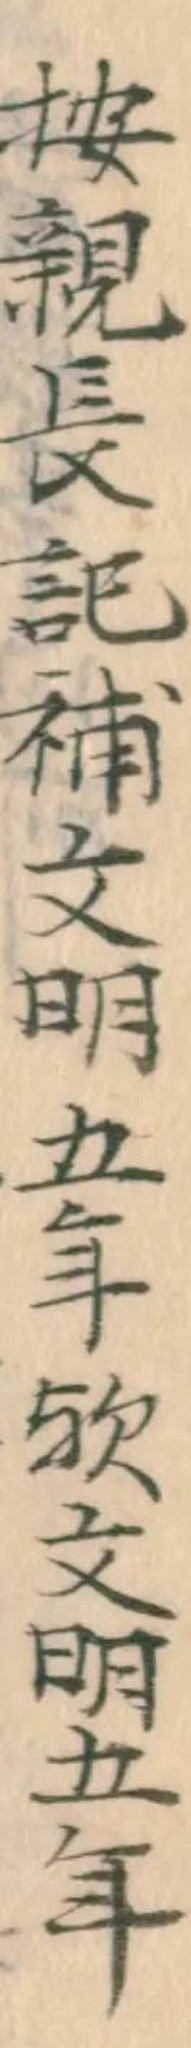按親長記補文明五年歟文明五年
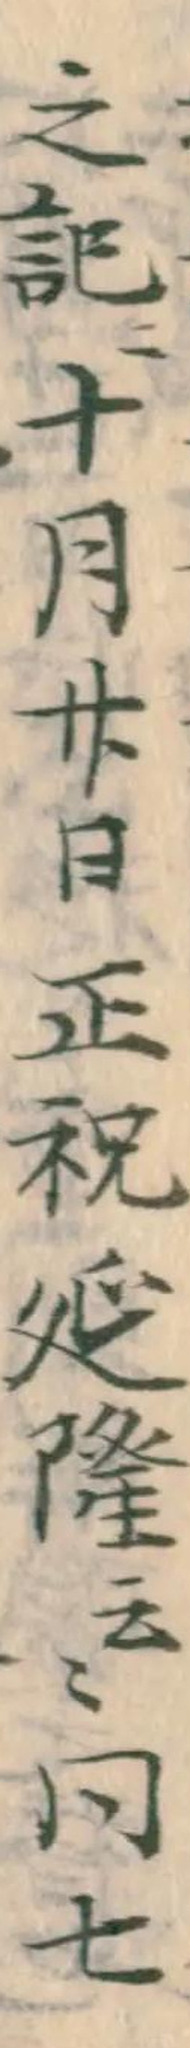之記ニ十月廿日正祝延隆云々同七
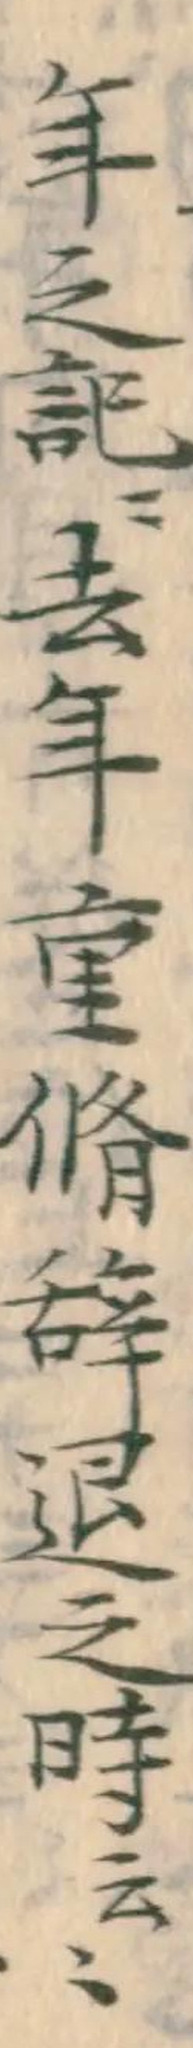年之記ニ去年重脩辞退之時云々
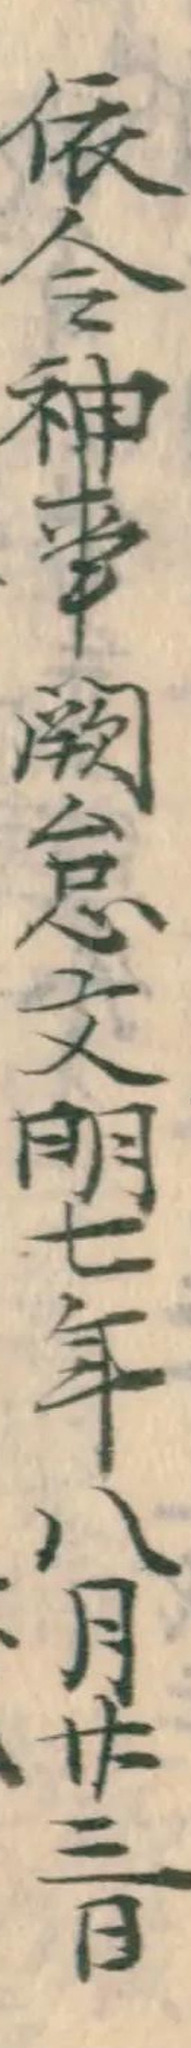依令神事闕怠文明七年八月廿三日
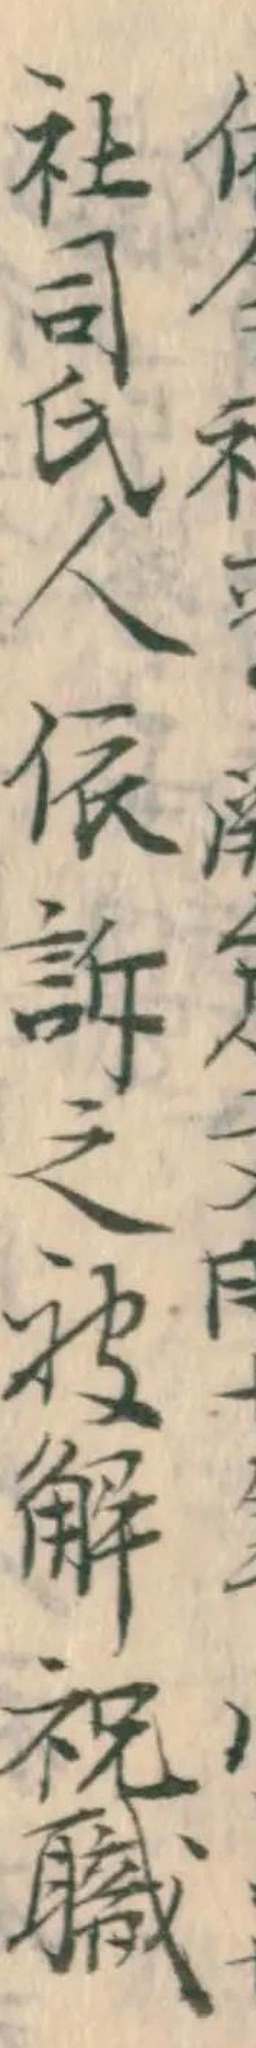社司氏人依訴之被解祝職
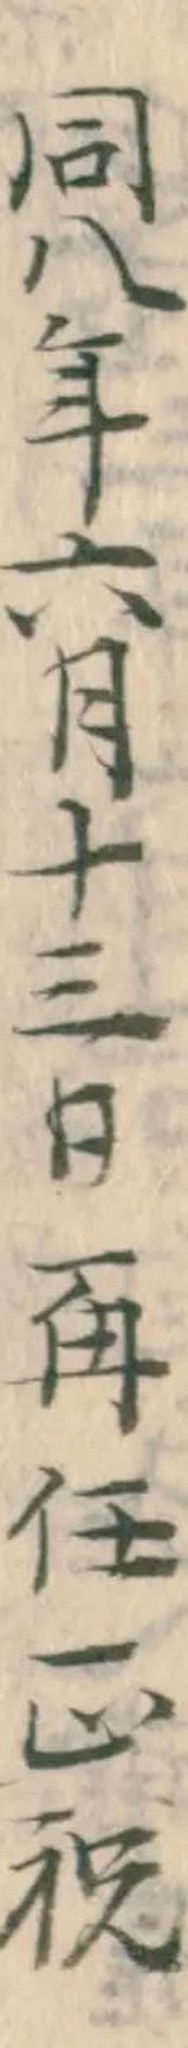同八年六月十三日再任正祝
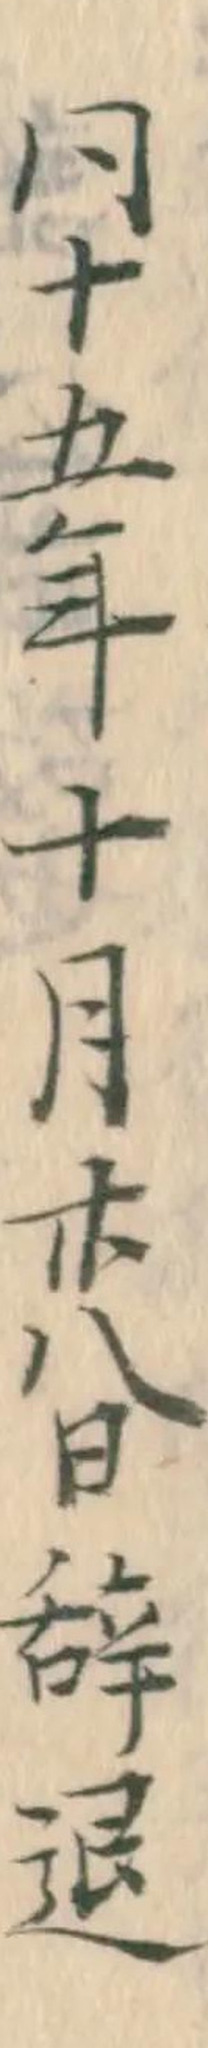同十五年十月廿八日辞退
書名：賀茂社記録. 第23冊
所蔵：国立国会図書館 National Diet Library, JAPAN
